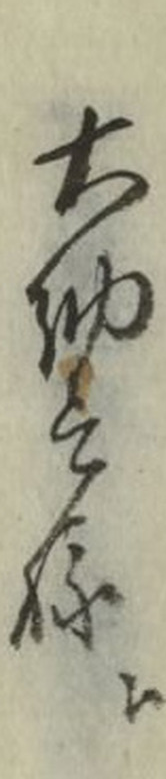大納言様え
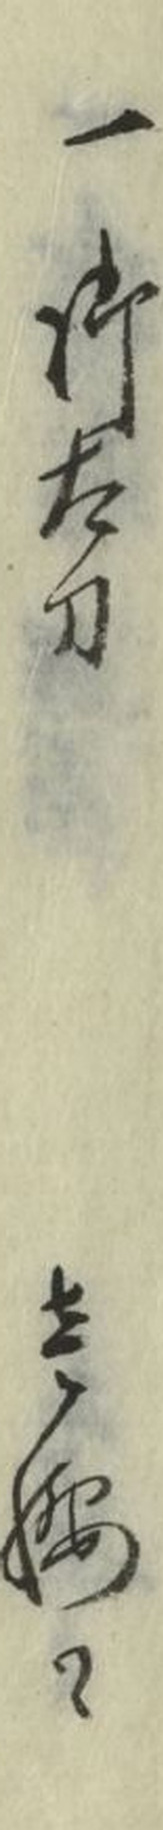一御太刀一腰ツヽ

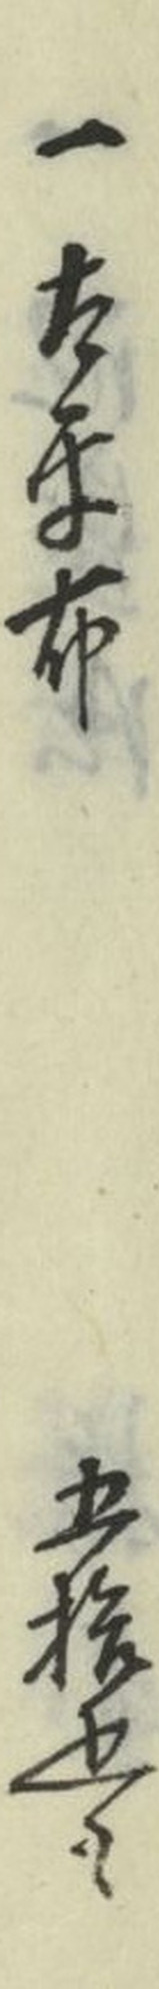一太平布五拾疋ツヽ
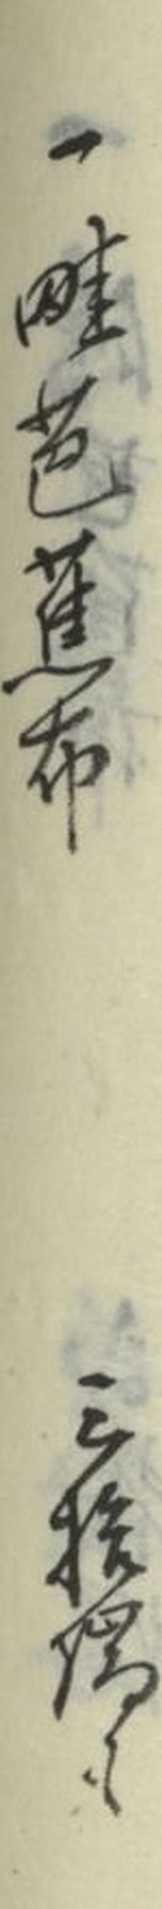一畦芭蕉布三拾端ツヽ
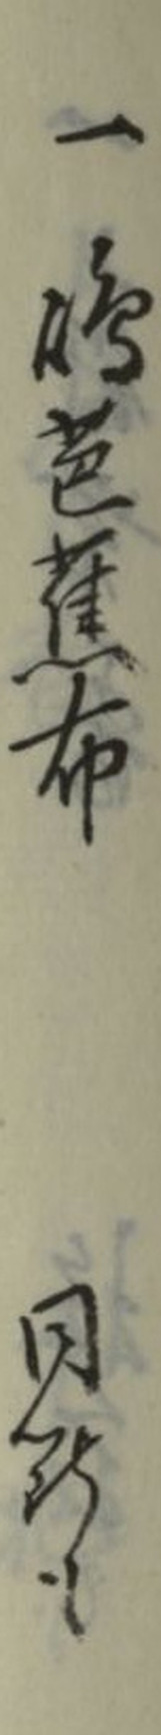一島芭蕉布同断ツヽ
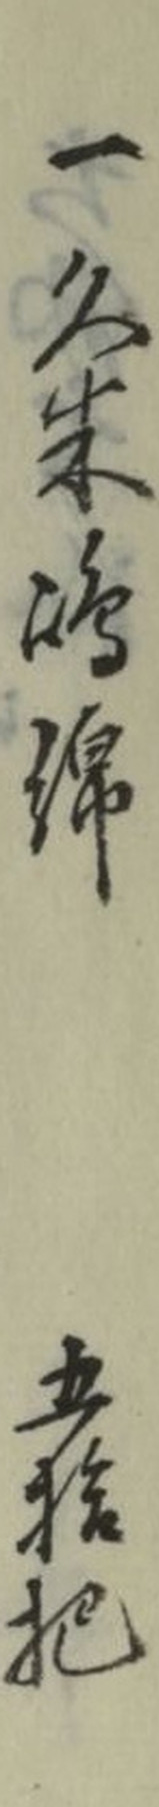一久米島綿五拾把
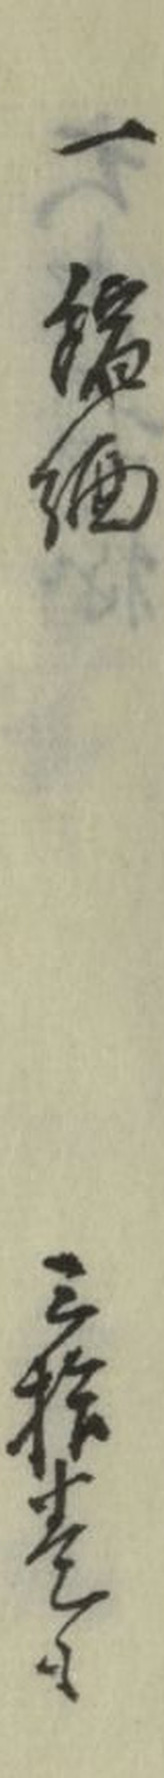一縮緬二十巻ツヽ
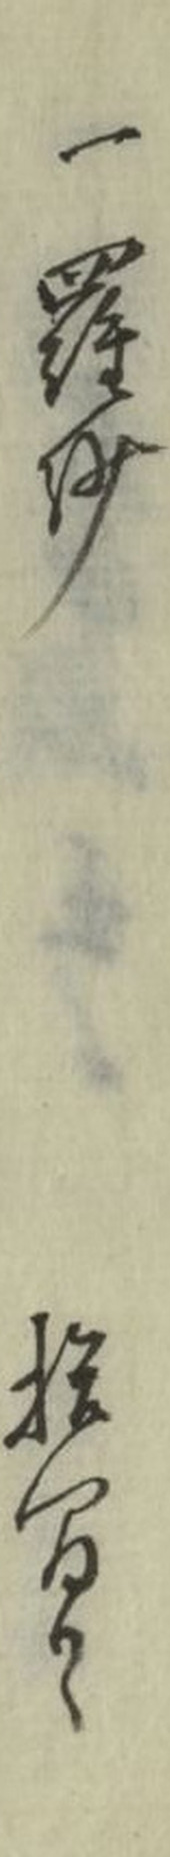一羅紗拾間ツヽ
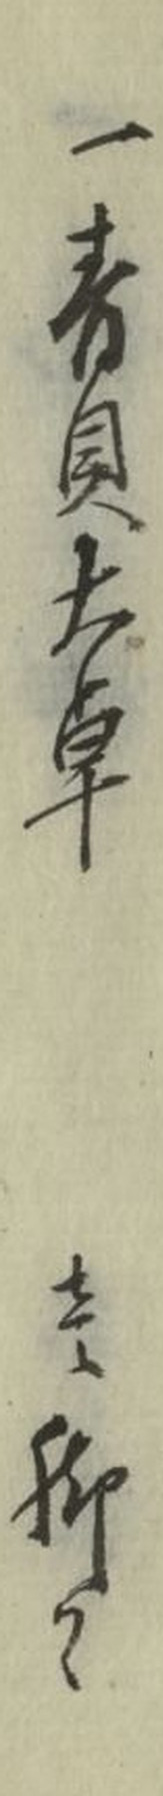一青貝大卓壱脚ツヽ
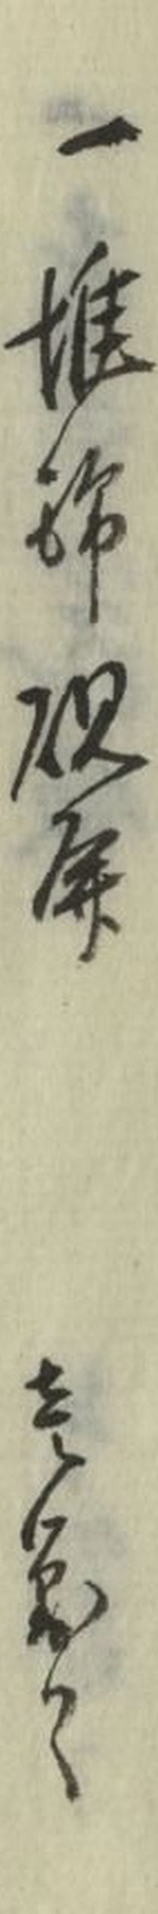一堆綿硯屏壱対ツヽ

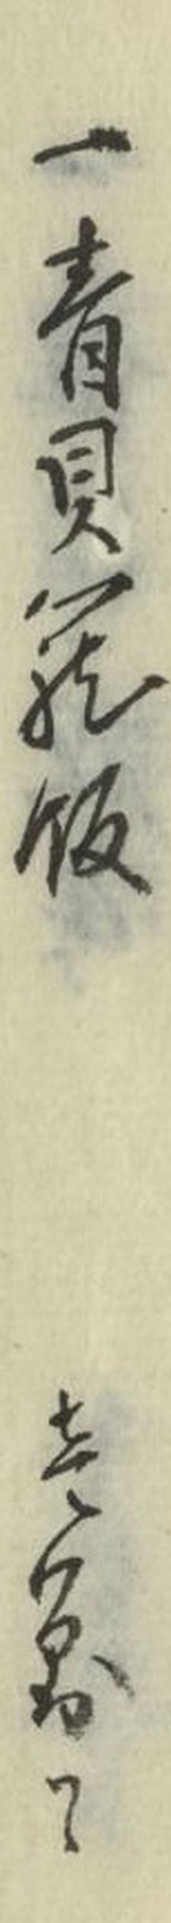一青貝籠飯壱対ツヽ
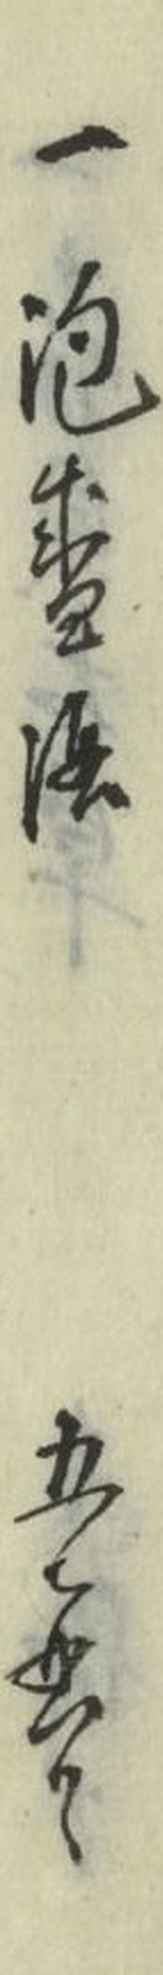一泡盛酒五壺ツヽ
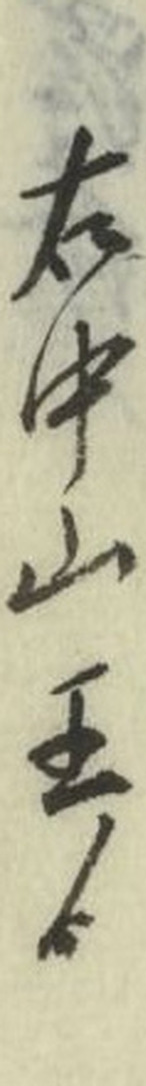右中山王ゟ
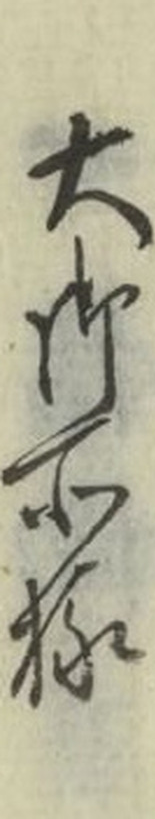大御所様
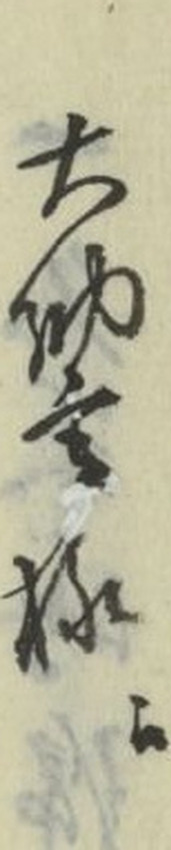大納言様え
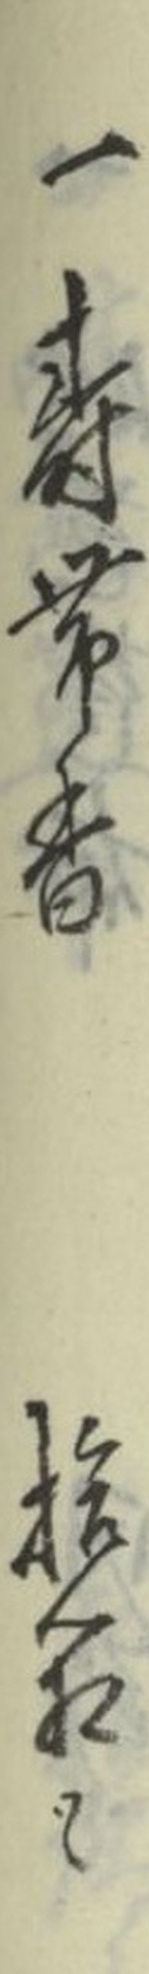一寿帯香拾箱ツヽ
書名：琉球人来朝記 三
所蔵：University of the Ryukyus Library
